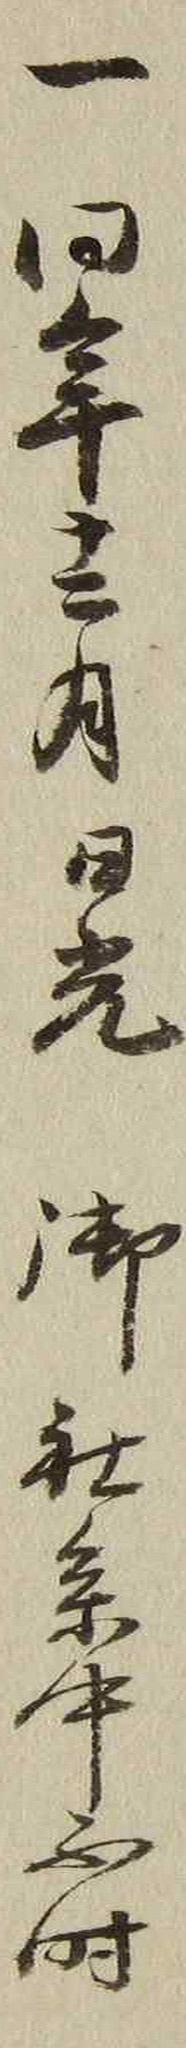一同年十二月日光御社参中不時
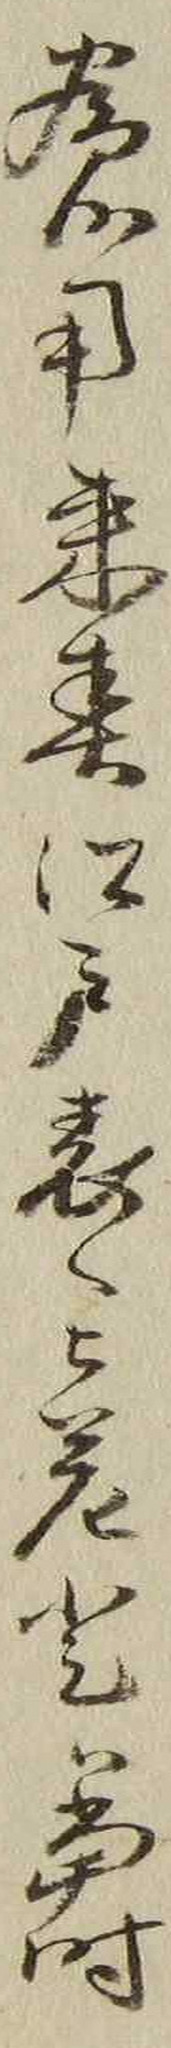為御用来春江戸表へ被差登候当時
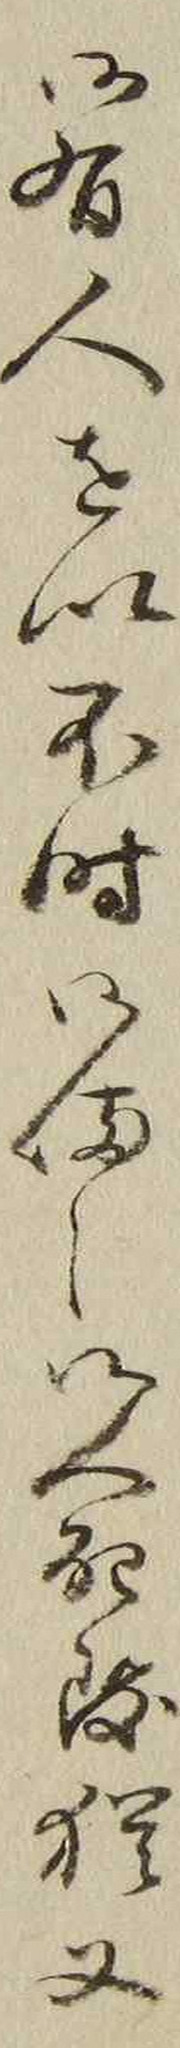御有人を以不時御備之御人配致猶又
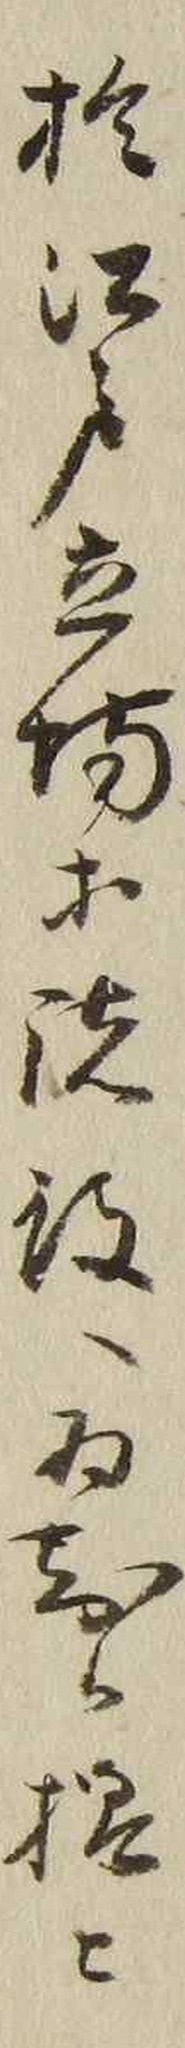於江戸立帰等諸役へ為知候様被

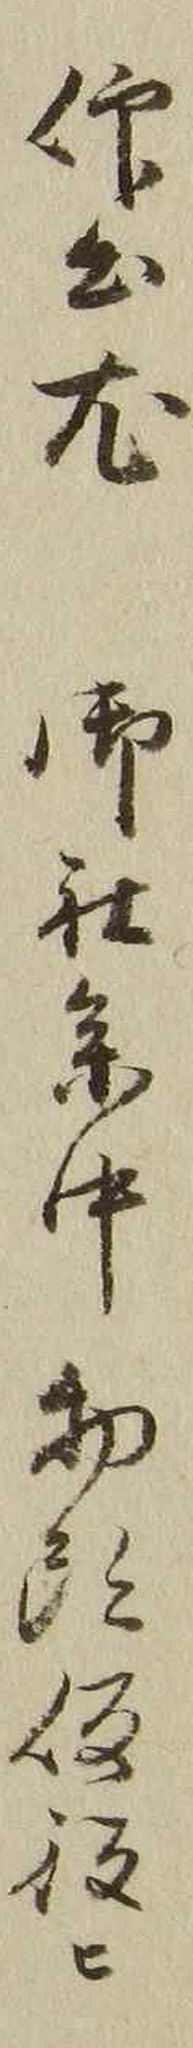仰出尤御社参中物頭仮役被
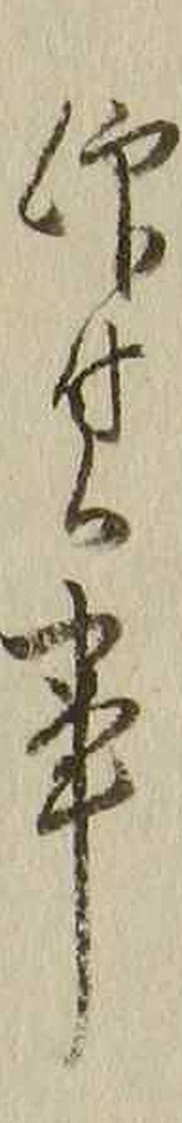仰付候事
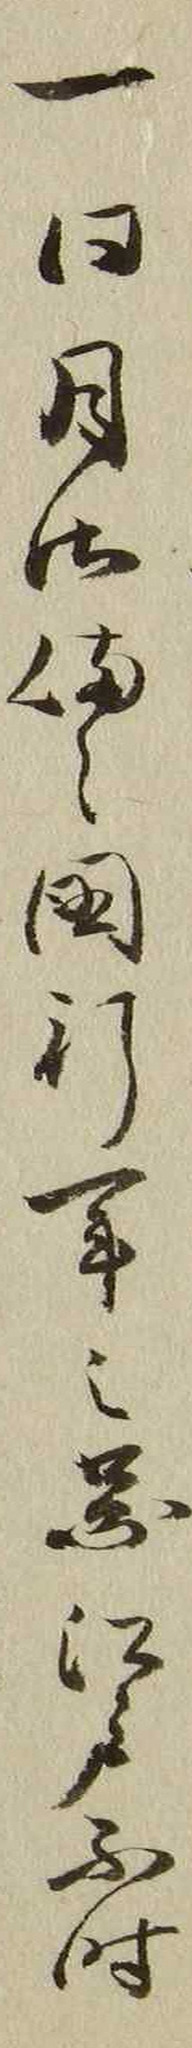一同月御備之図行軍之図江戸不時
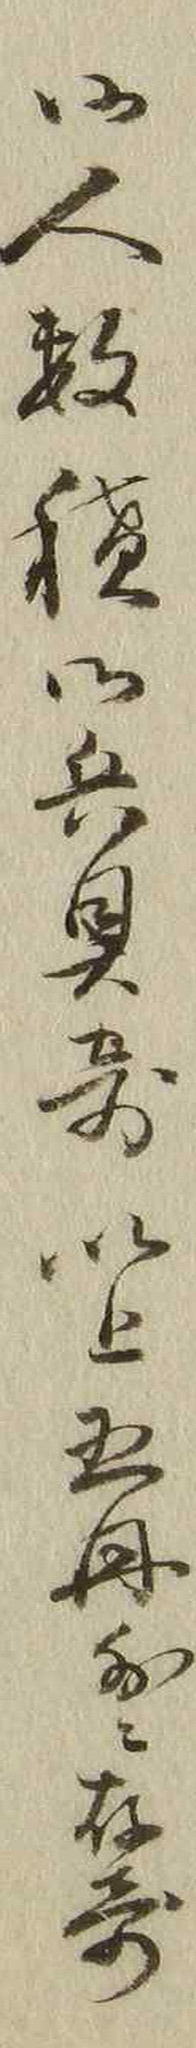御人数積御兵具寄以上五冊外ニ存寄
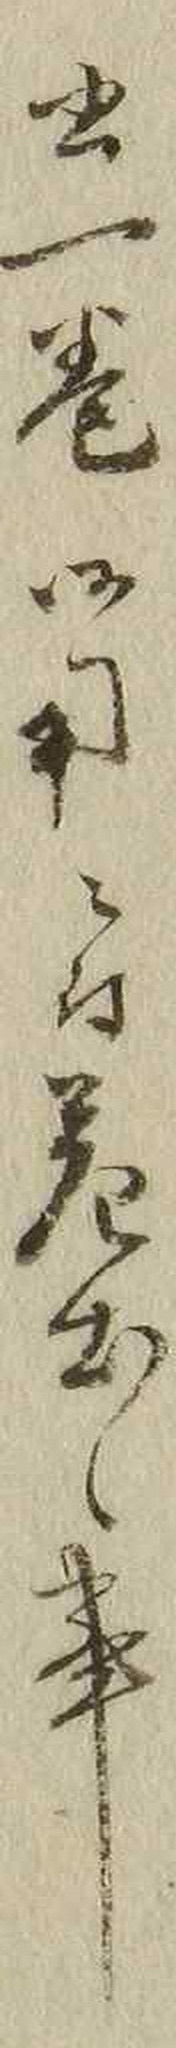書一巻御用ニ付差出候事
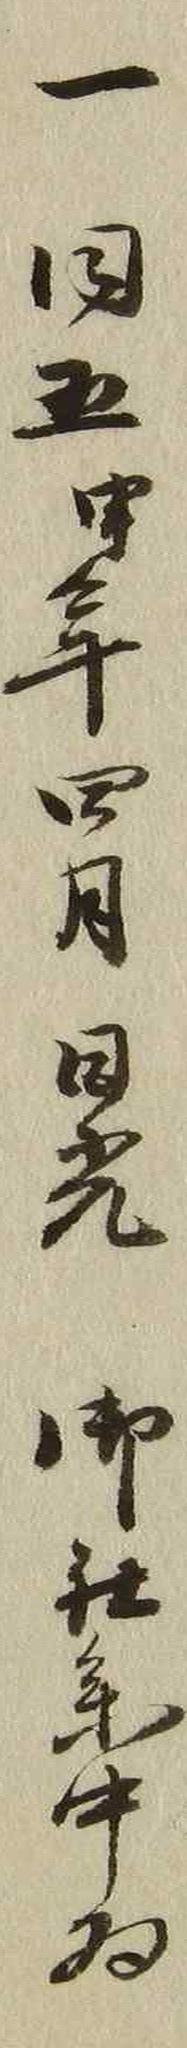一同五申年四月日光御社参中為
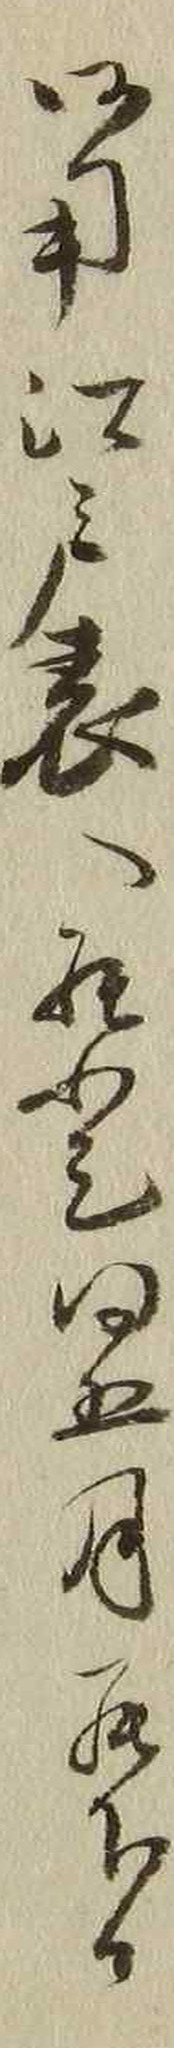御用江戸表へ罷登同五月罷下候
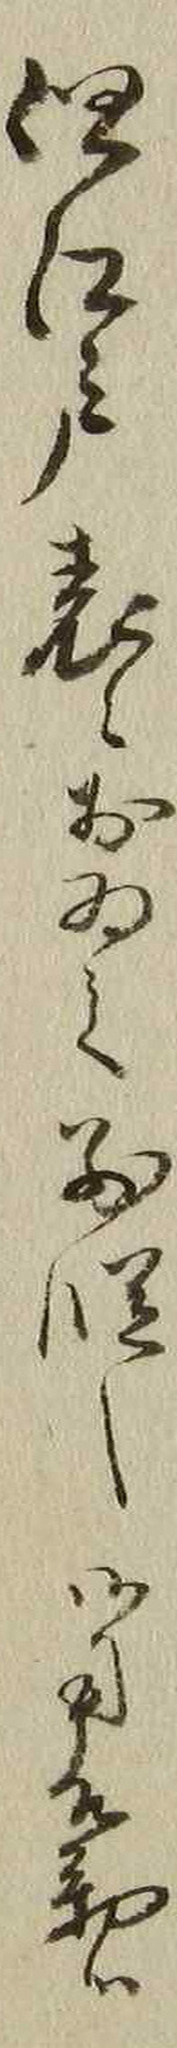但江戸表ニおゐて前段之御用相勤候
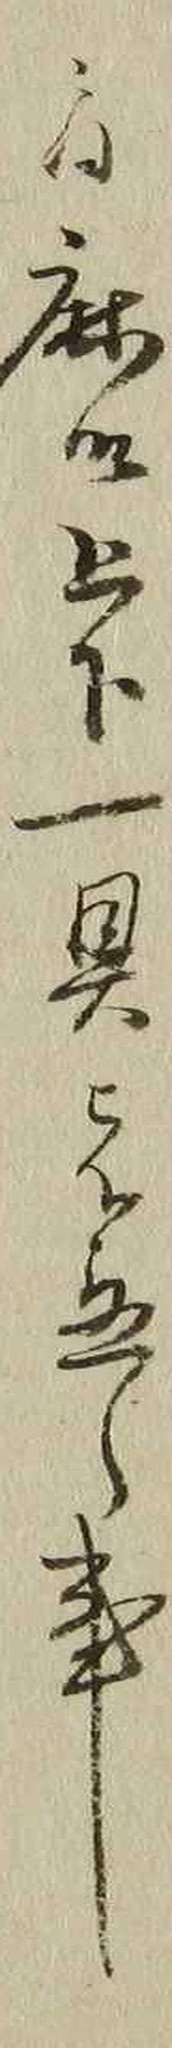ニ付麻御上下一具被下置候事
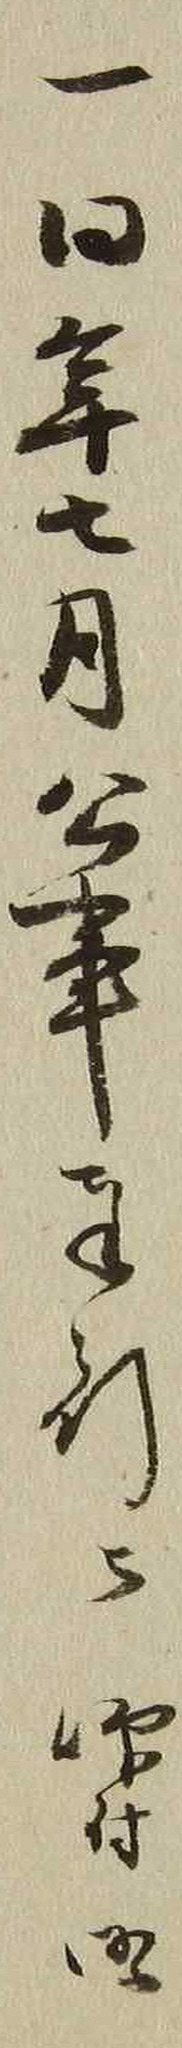一同年七月公事奉行被仰付御
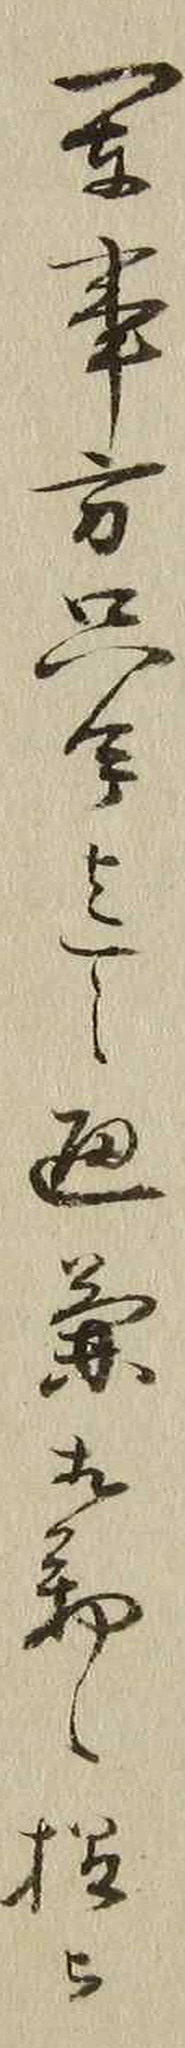軍事方只今迄之通兼相勤候様被
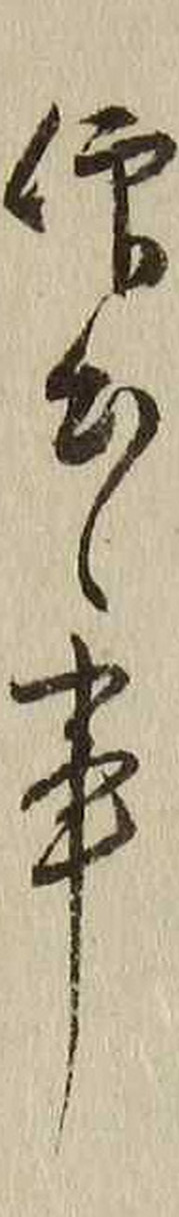仰出候事
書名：諸士系譜　巻之236　ふ之部4
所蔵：会津若松市立会津図書館
